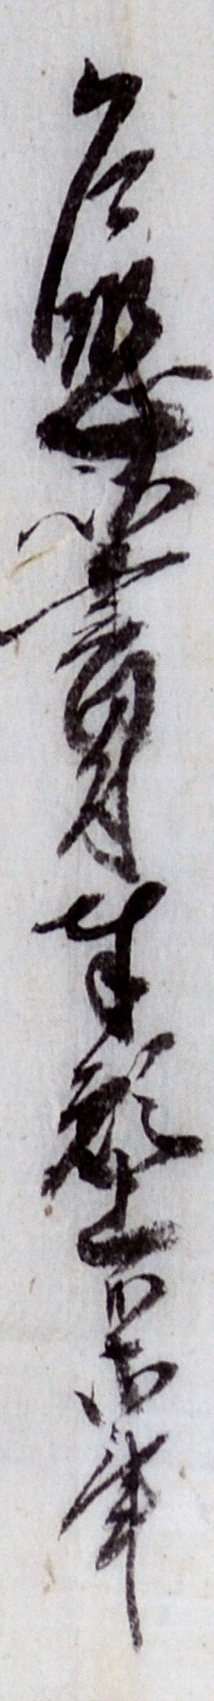乍恐以書付奉願上候御事
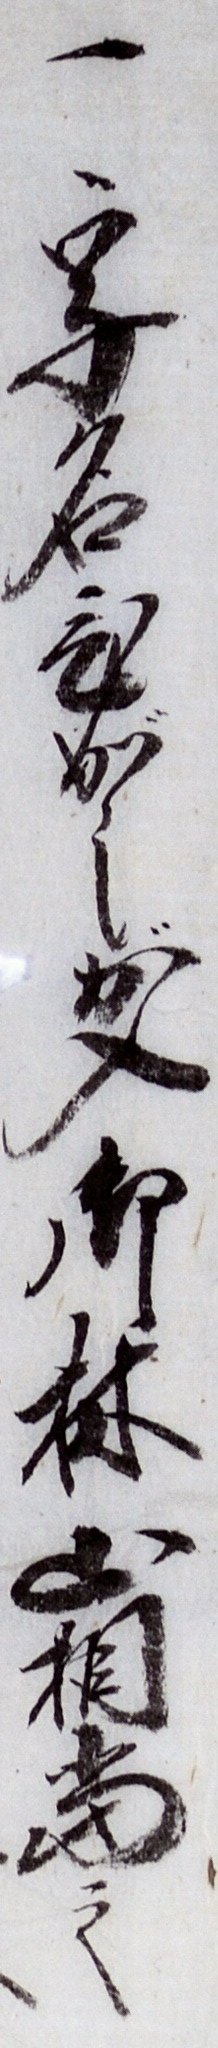一字名ひがしが入御林山相当之
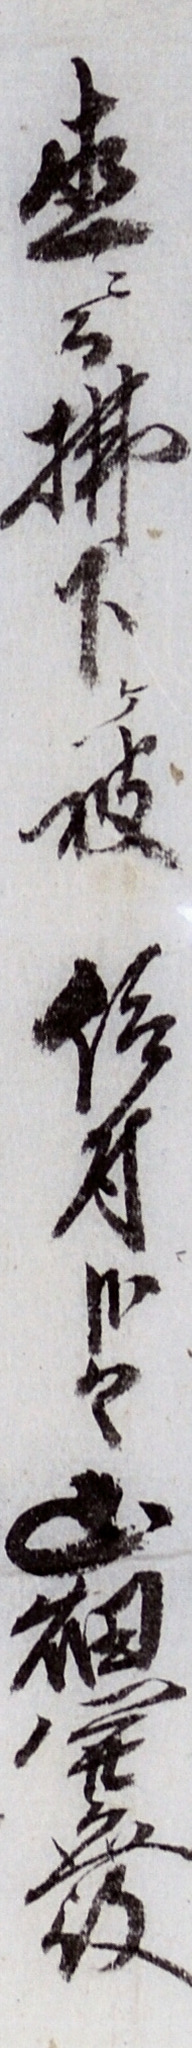直ニ而払下ケ被仰付候ハゝ山畑開発
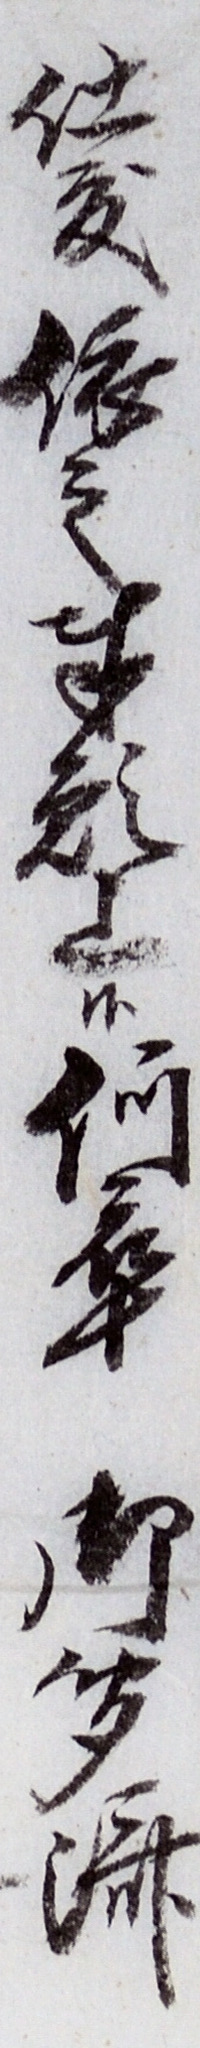仕度依之奉願上候何卒御聞済
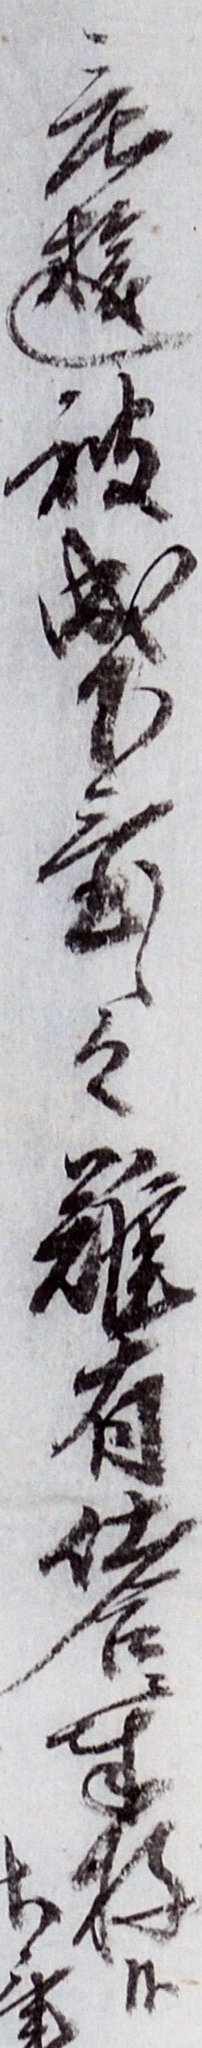被遊被成下置候ハゝ難有仕合ニ奉存候
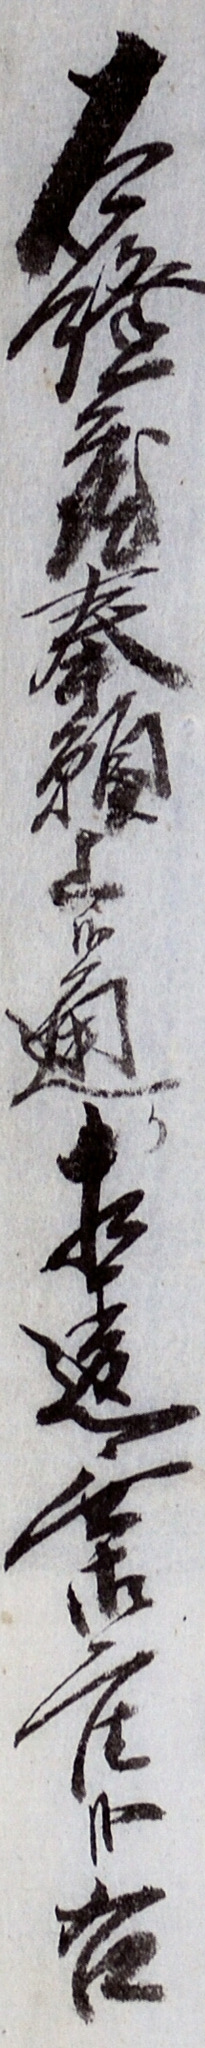右縫蔵奉願上候通り相違無御座候右
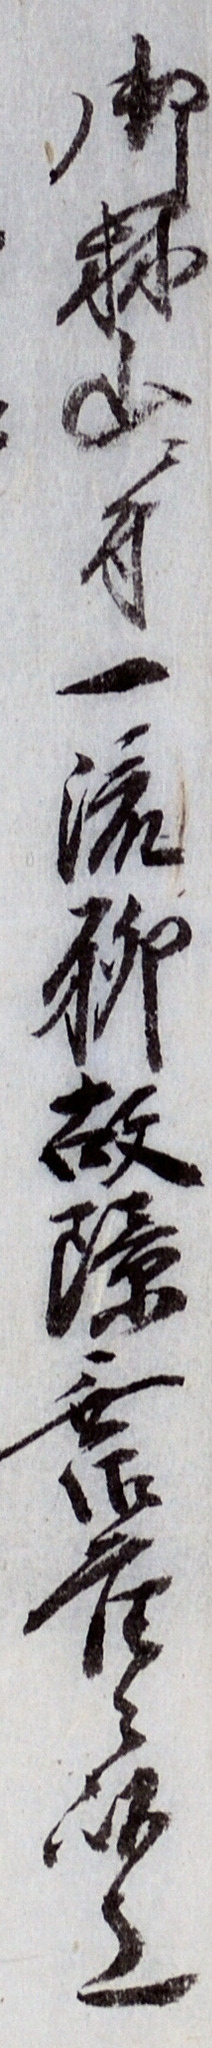御林山ニ付一統聊故障無御座候以上
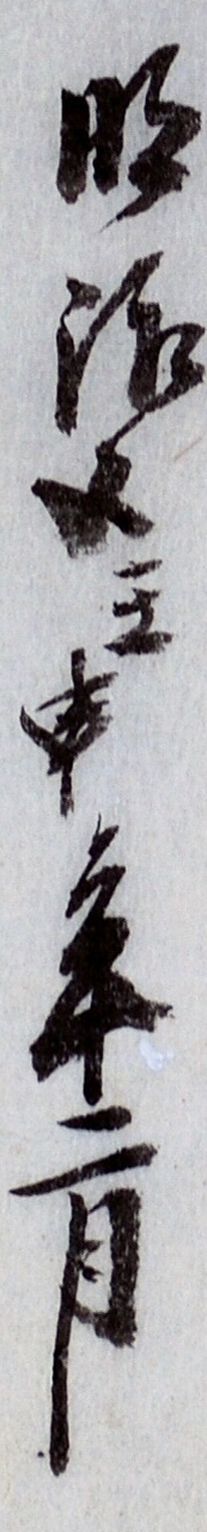明治五壬申年二月
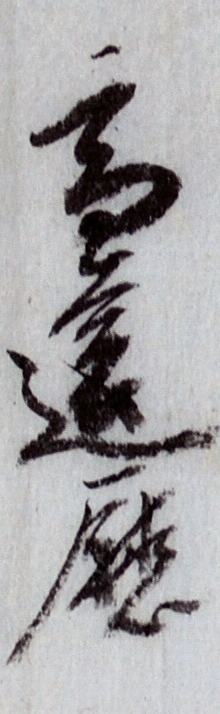高遠庁
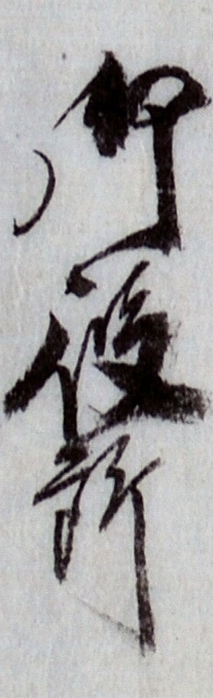御役所

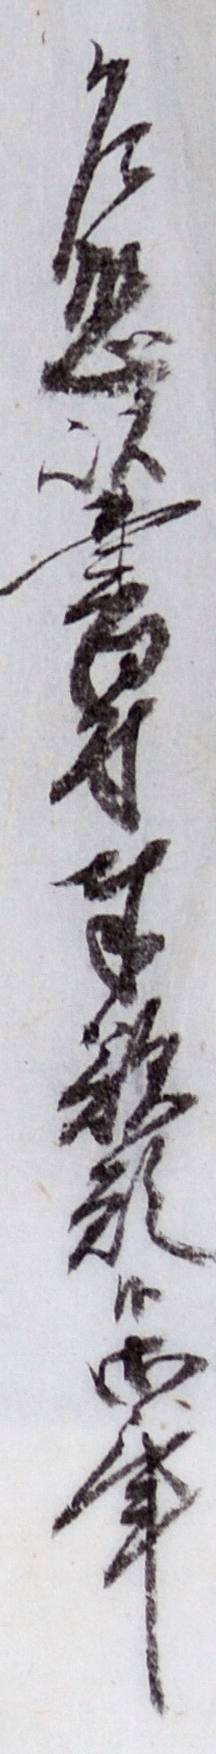乍恐以書付奉歎願候御事
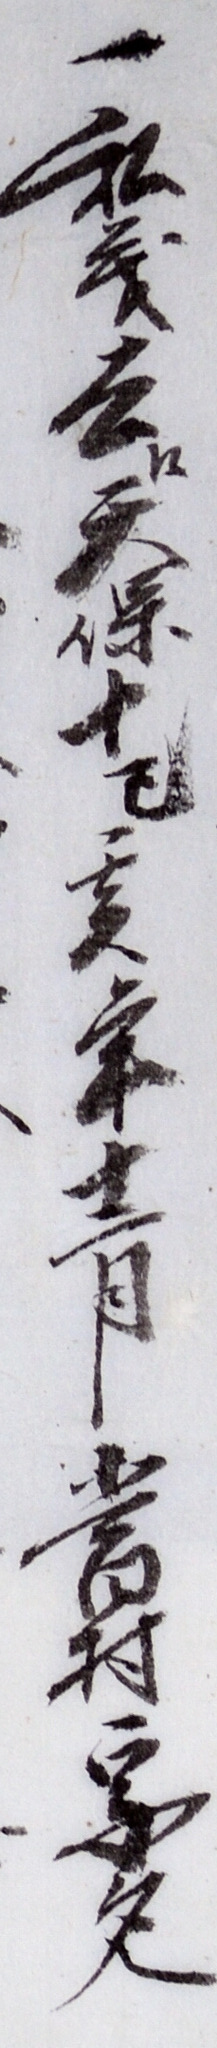一私義去ル天保十己亥年十二月当村字名
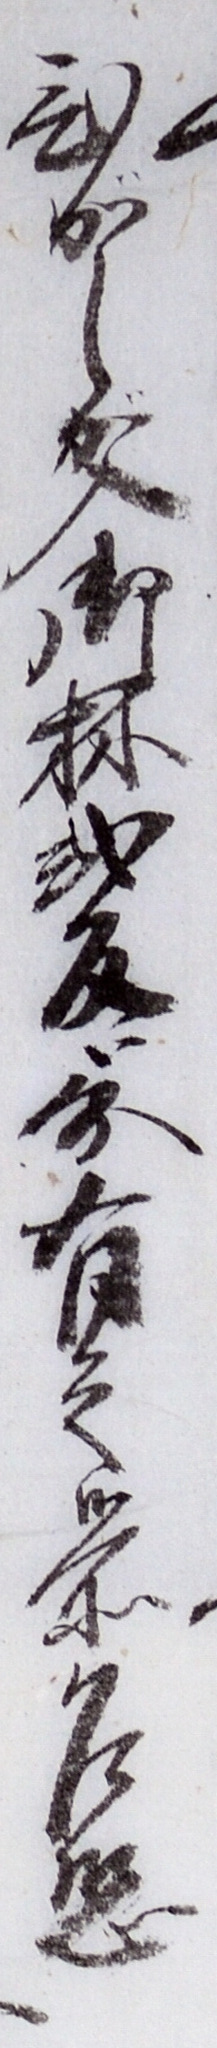ひがしが入御林弐反歩有之候所乍恐
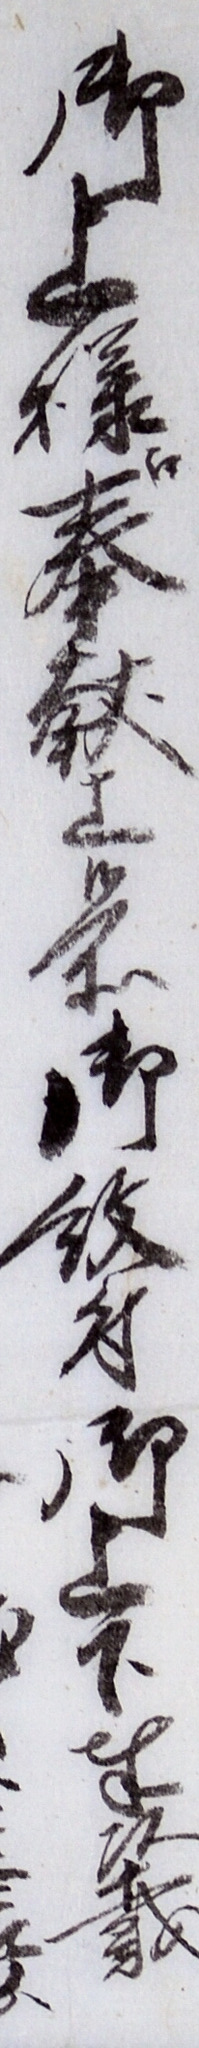御上様江奉献上候所御紋付御上下奉頂戴
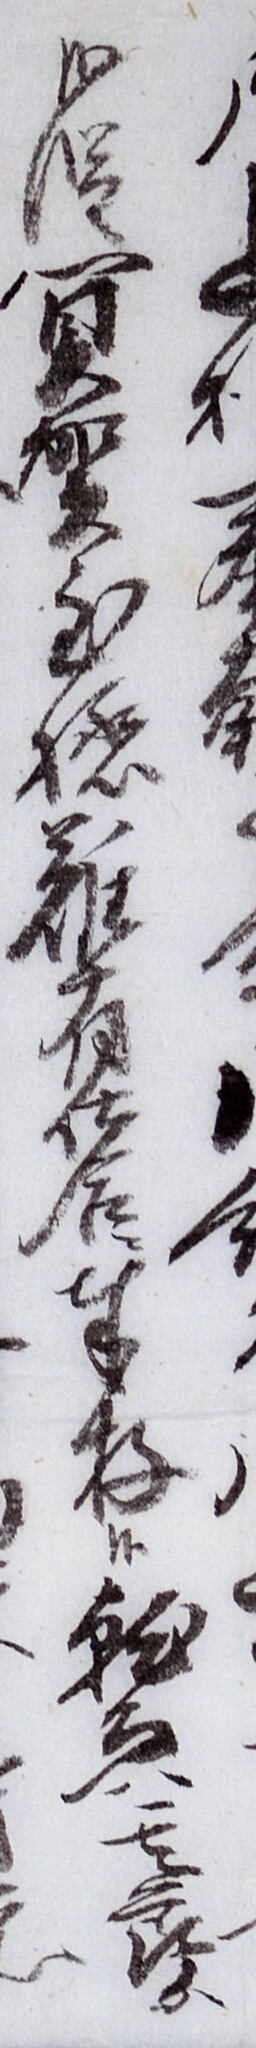候段冥賀至極難有仕合ニ奉存候就而ハ其節ゟ
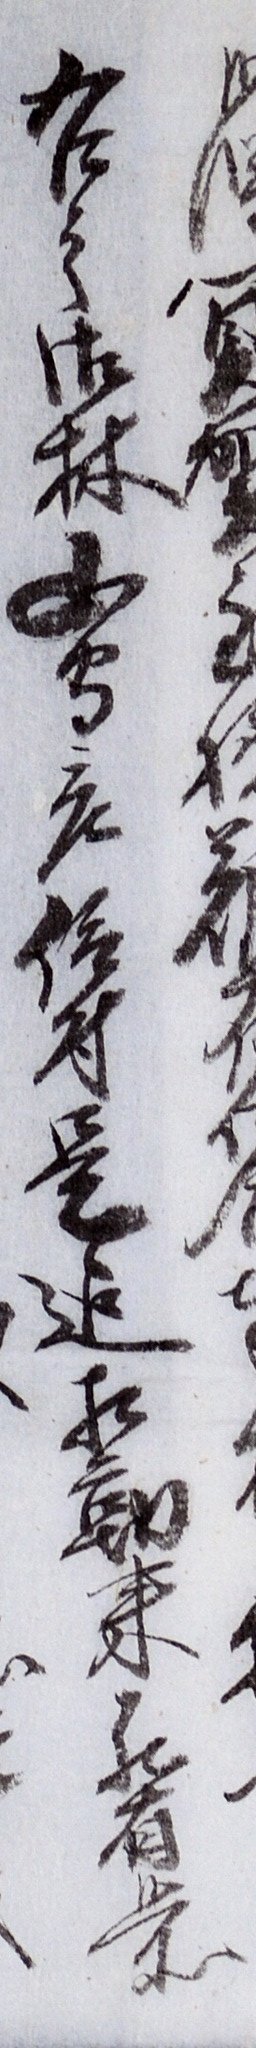右之御林山守被仰付是迄相勤来罷有候所
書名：乍恐以書付奉願上候御事
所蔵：伊那市立高遠町図書館・合同会社AMANE
